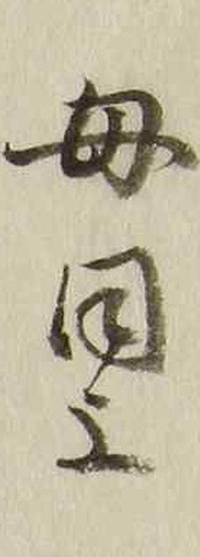母同上
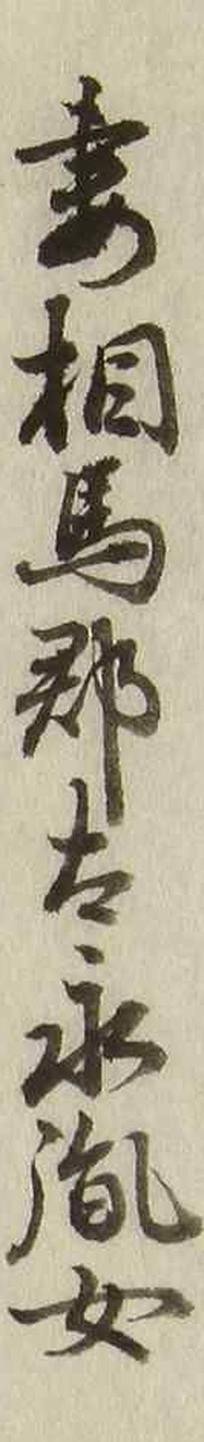妻相馬郡太永胤女
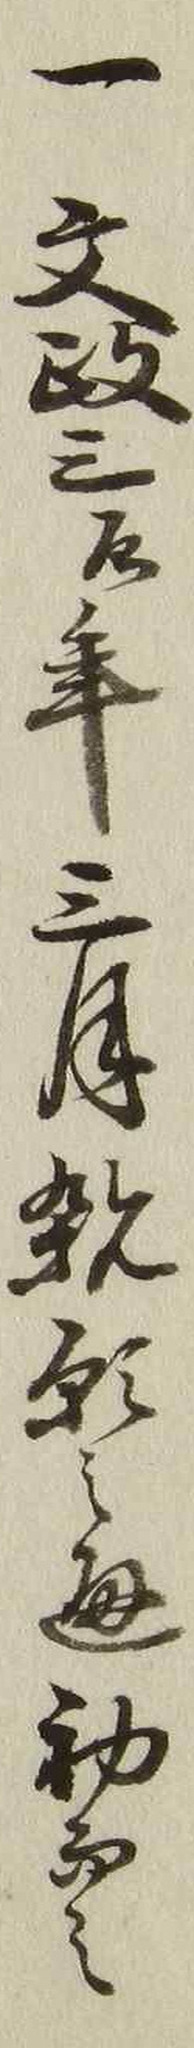一文政三辰年三月親願之通初而之
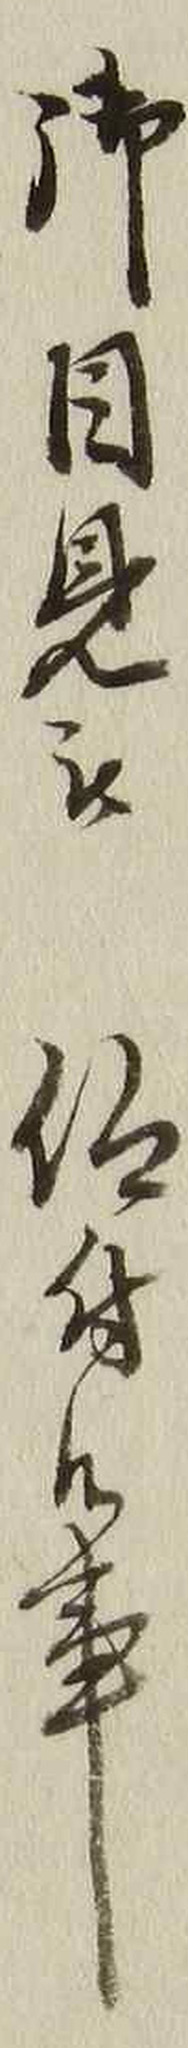御目見被仰付候事
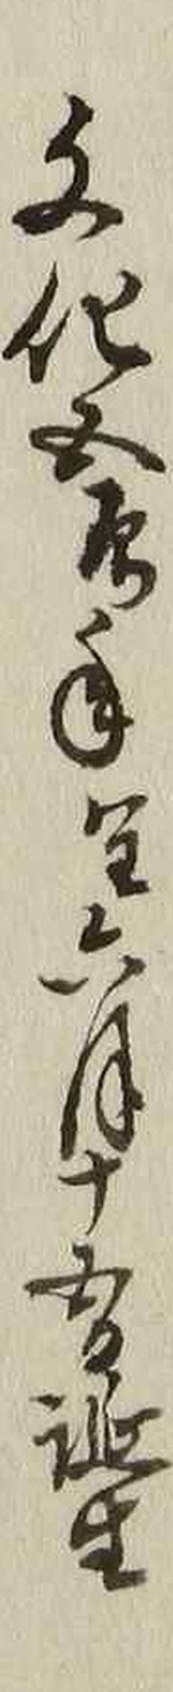文化五辰年閏六月十五日誕生
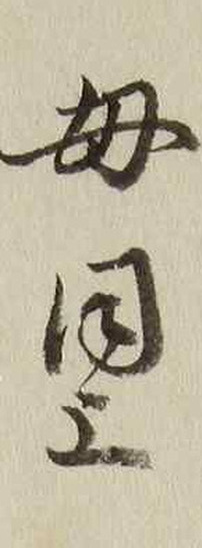母同上
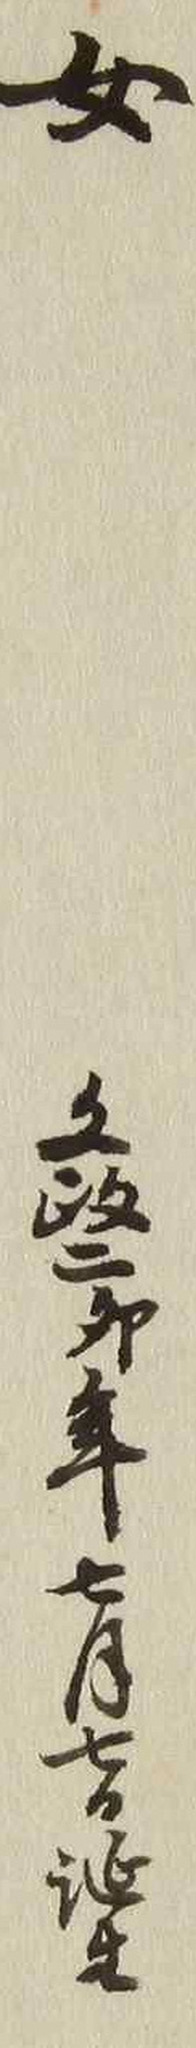文政二卯年七月七日誕生
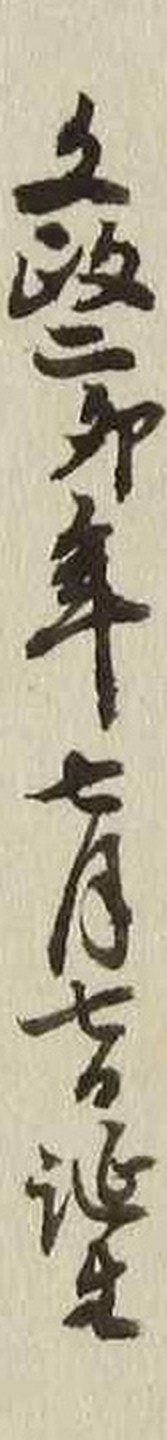文政二卯年七月七日誕生
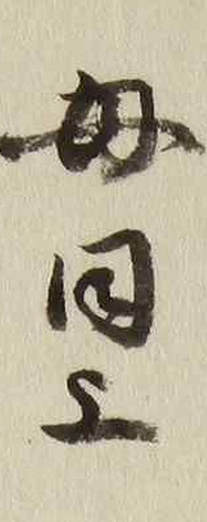母同上

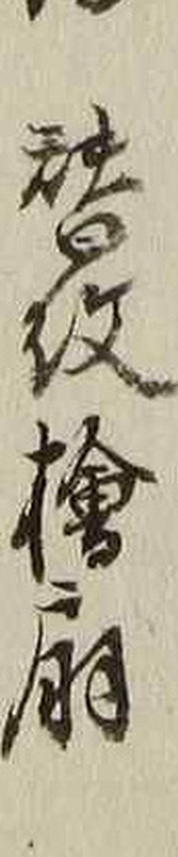替紋檜扇
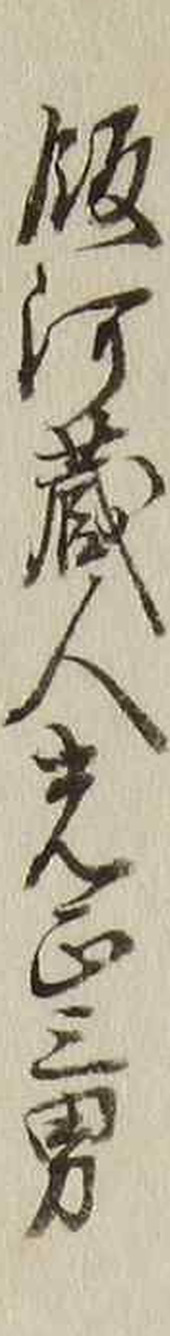飯河蔵人光正三男
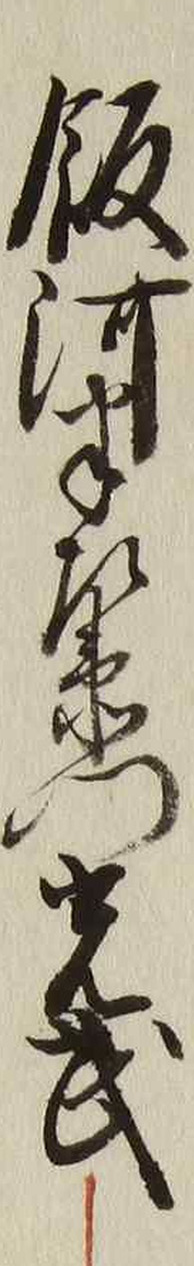飯河半左衛門光武
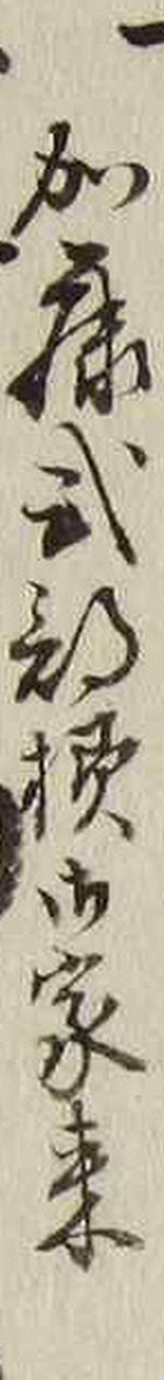加藤式部様御家来
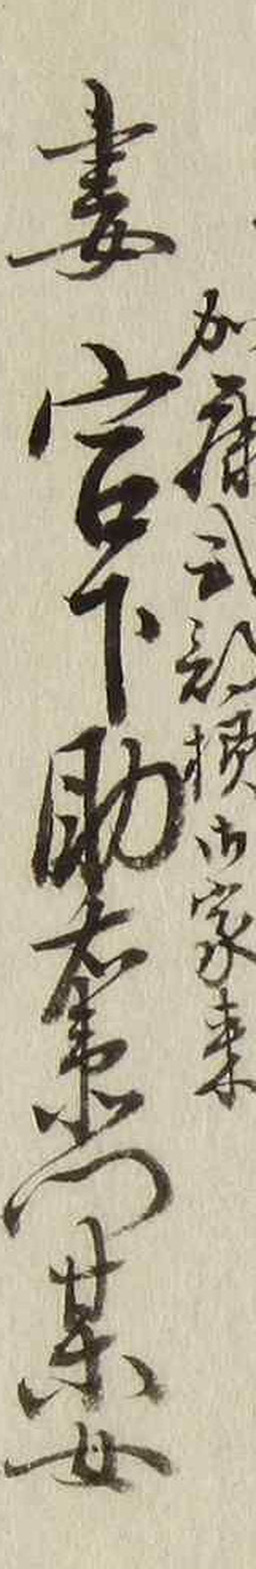妻宮下助右衛門某女
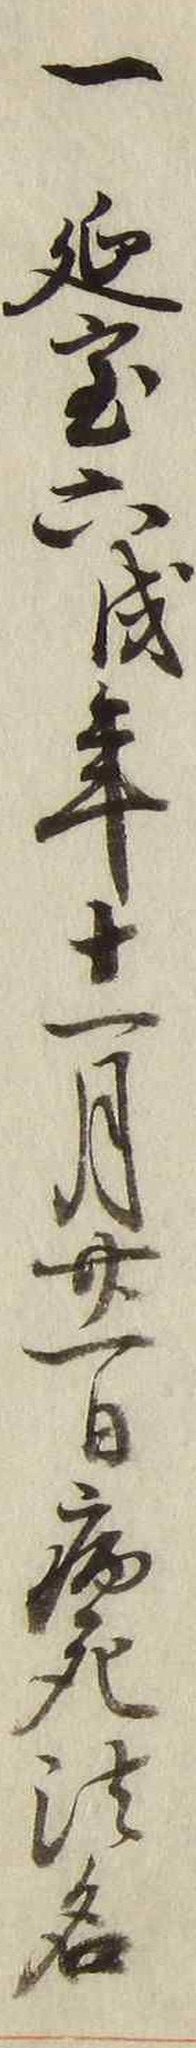一延宝六戌年十一月廿一日病死法名

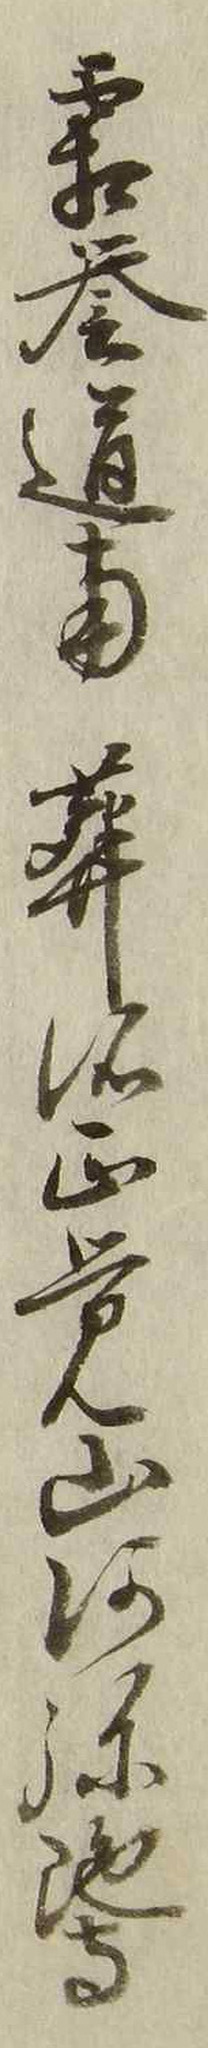霜誉道南葬所正覚山阿弥陀寺
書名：諸士系譜　巻之27　い之部27
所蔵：会津若松市立会津図書館
